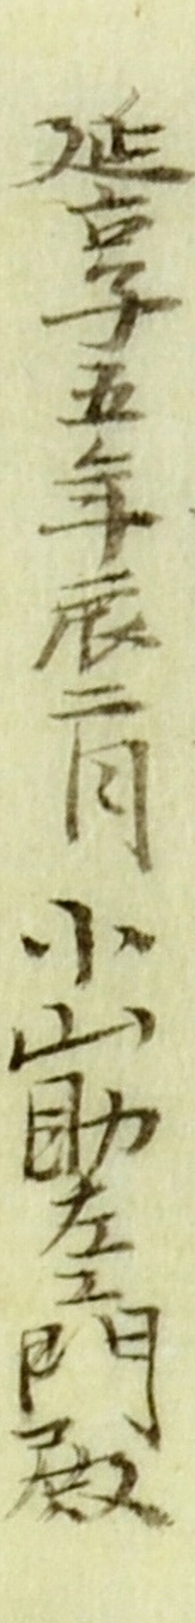延享五年辰二月小山助左エ門殿
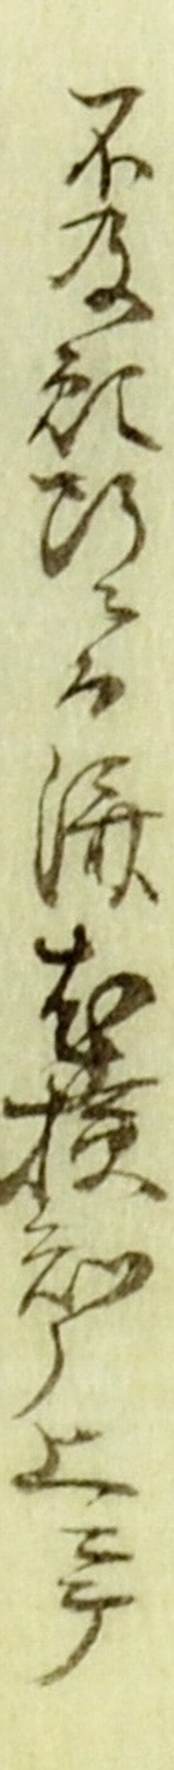不及願頭二而済尤検知之上ニテ
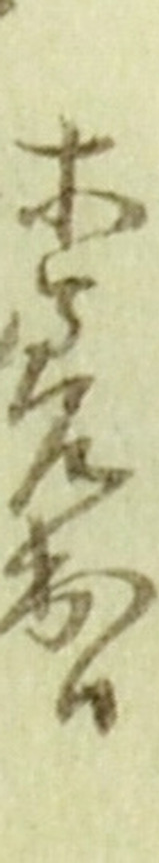等差出候
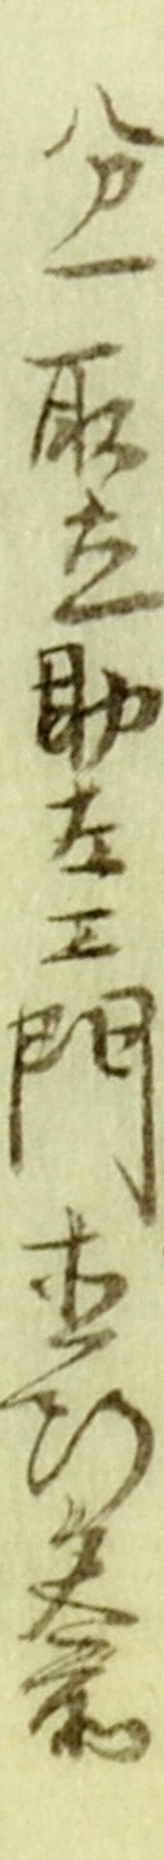分一取立助左エ門直頭名前
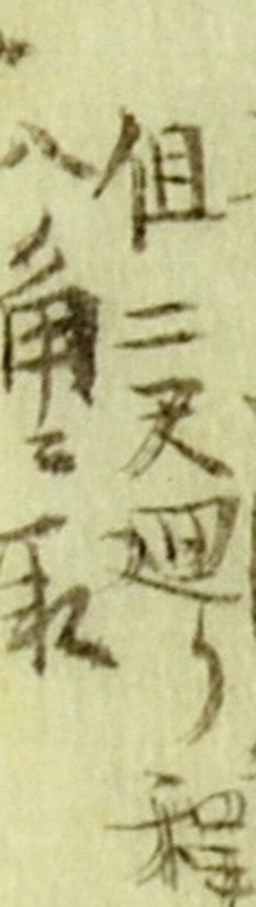八角ニ取
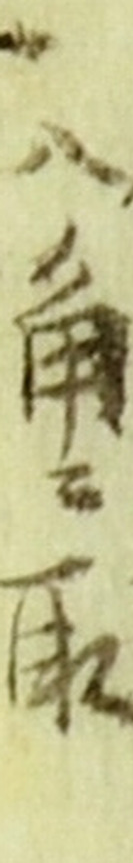八角ニ取
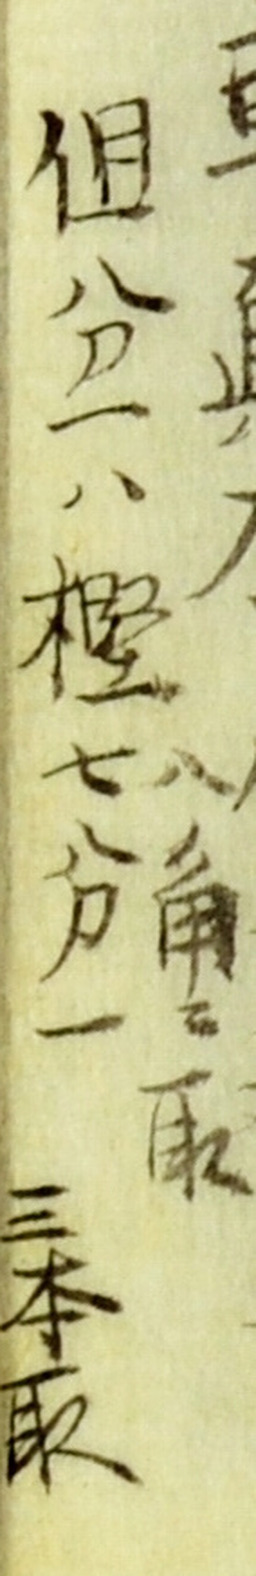但分一ハ樫七分一三本取

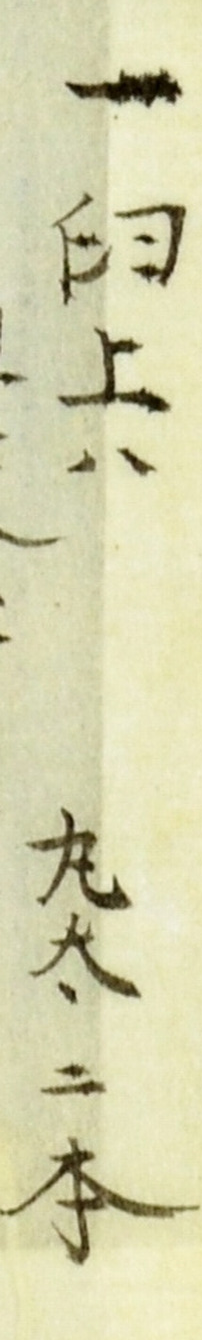一臼上ハ丸太二本
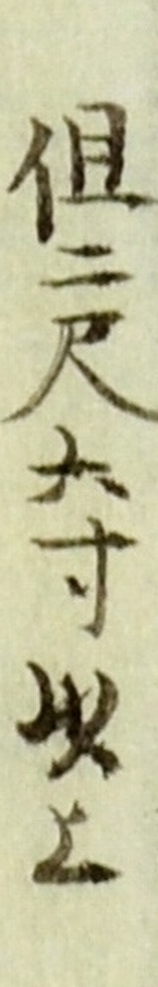但二尺六寸以上
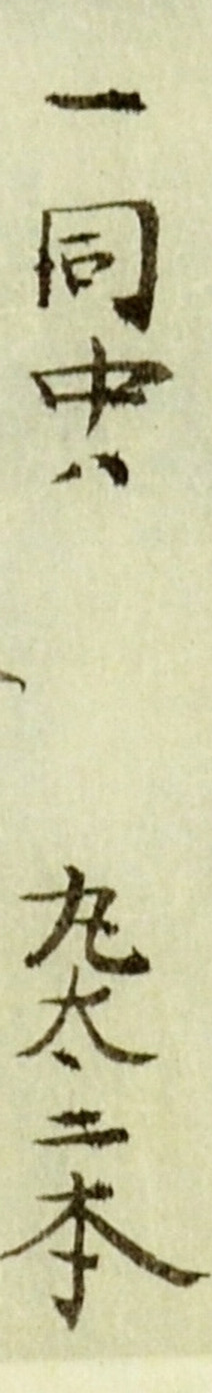一同中ハ丸太二本
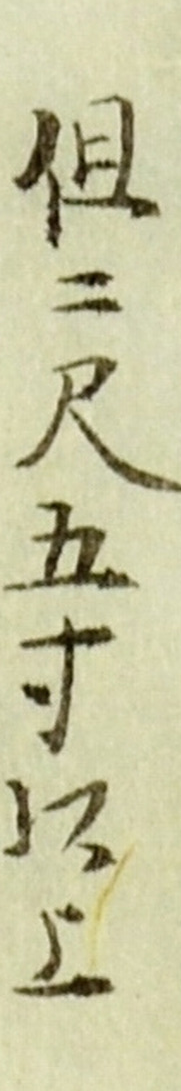但二尺五寸以上
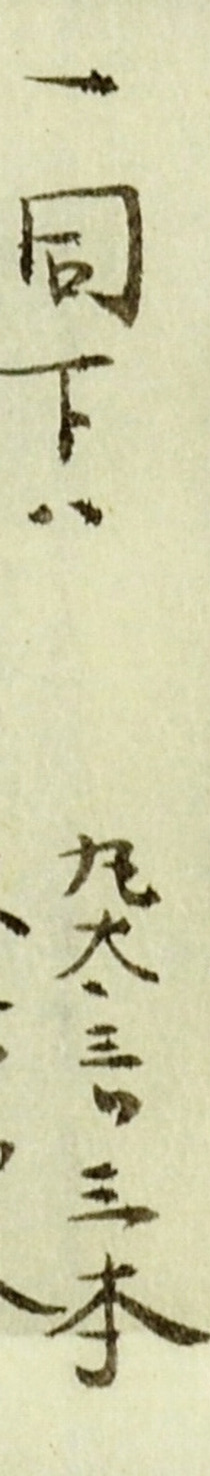一同下ハ丸太三ツ三本
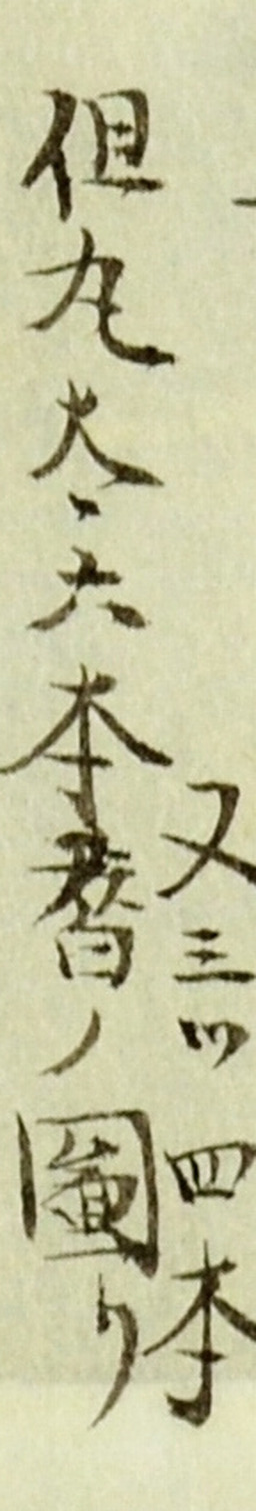但丸太六本替ノ図リ
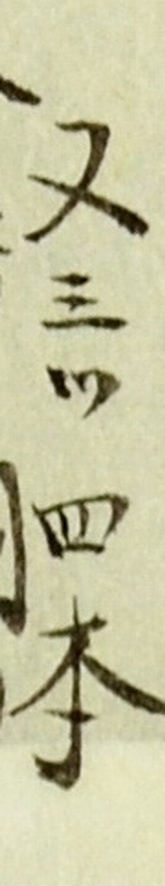又三ツ四本
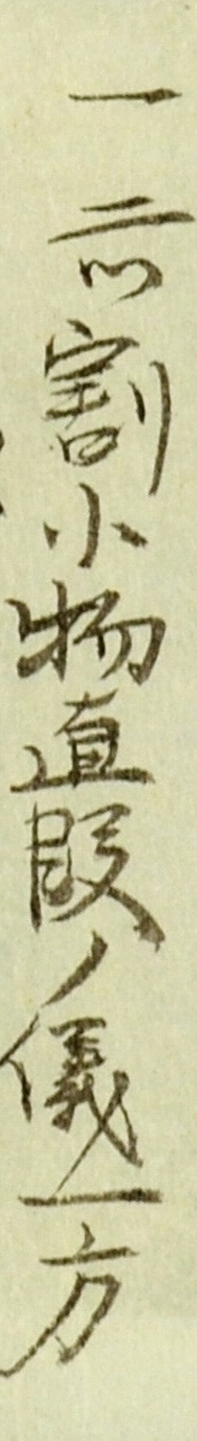一ニツ割小物直叚ノ儀一方
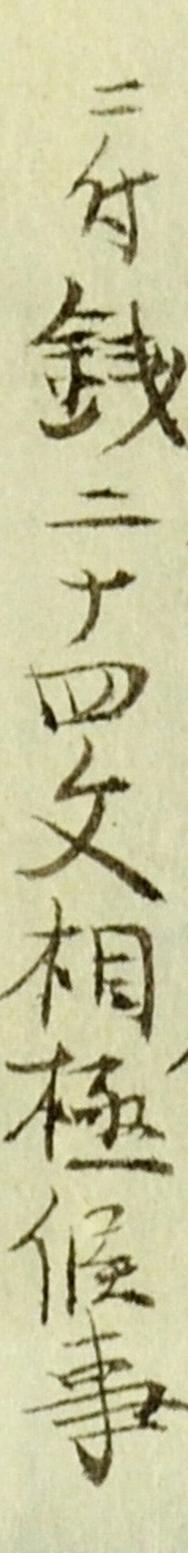ニ付銭二十四文相極候事
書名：分一御定法
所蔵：伊那市立高遠町図書館・合同会社AMANE
